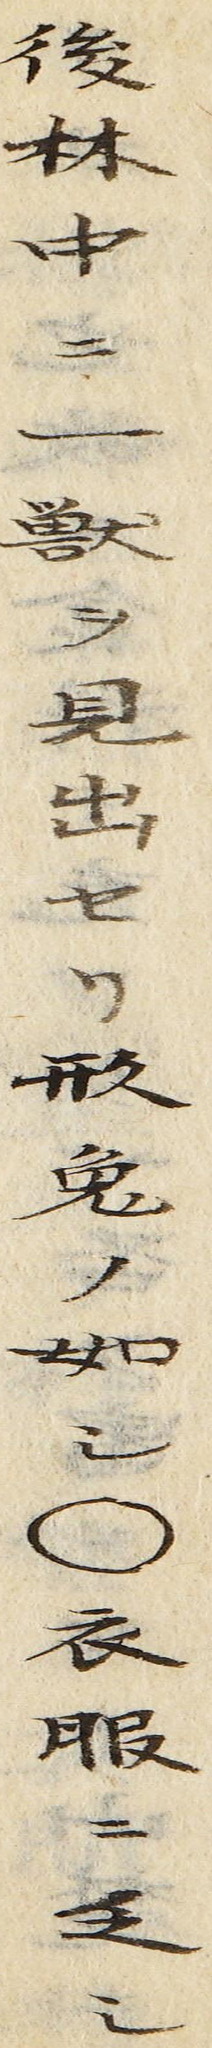後林中ニ一獣ヲ見出セリ形兎ノ如シ◯衣服ニ乏シ
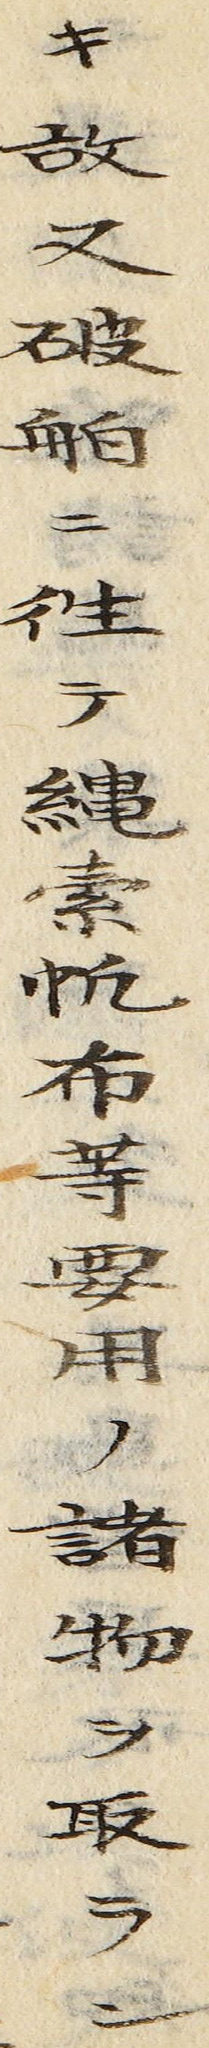キ故又破舶ニ往テ縄索帆布等要用ノ諸物ヲ取ラン
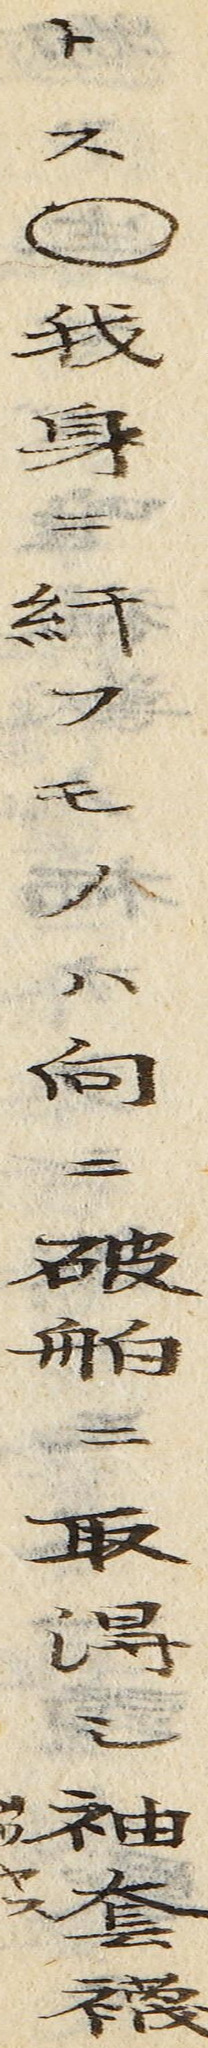トス◯我身ニ紆フモノハ向ニ破舶ニ取得シ袖套襪
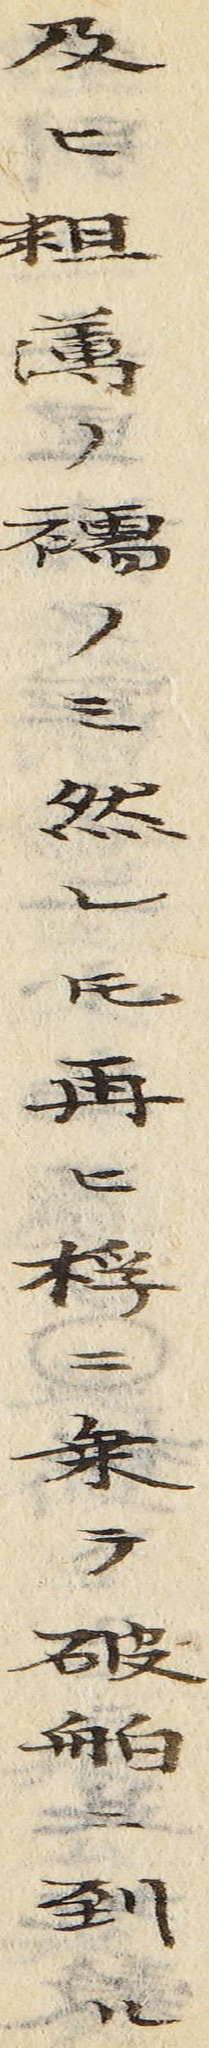及ヒ粗薄ノ襦ノミ然レトモ再ヒ桴ニ乗テ破舶ニ到ル
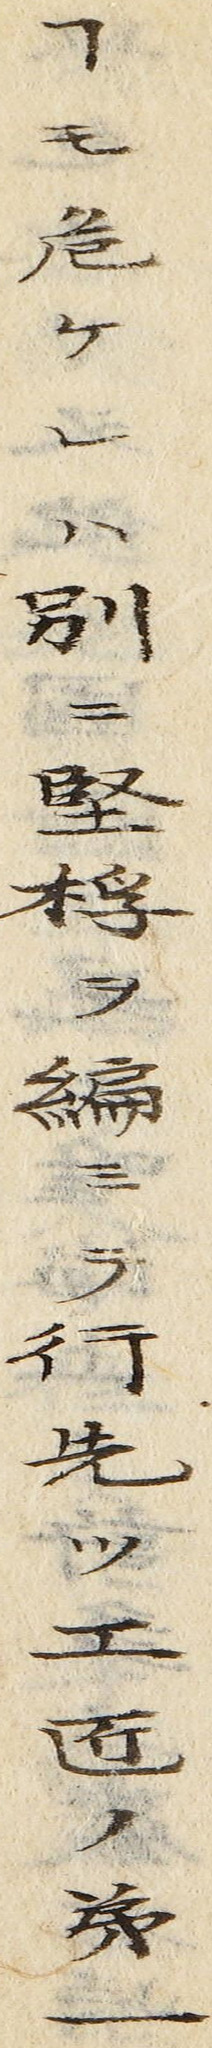コトモ危ケレハ別ニ堅桴ヲ編ミテ行先ツ工匠ノ第一
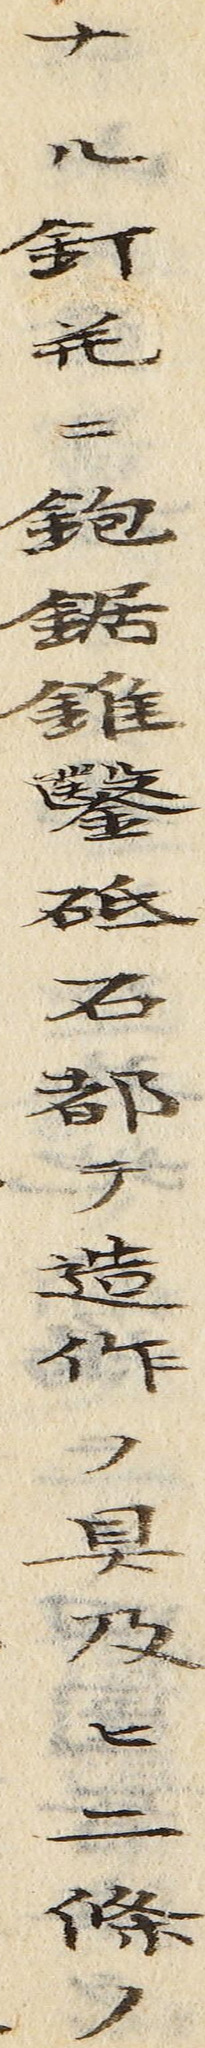ナル釘并ニ鉋鋸錐鑿砥石都テ造作ノ具及ヒ二條ノ
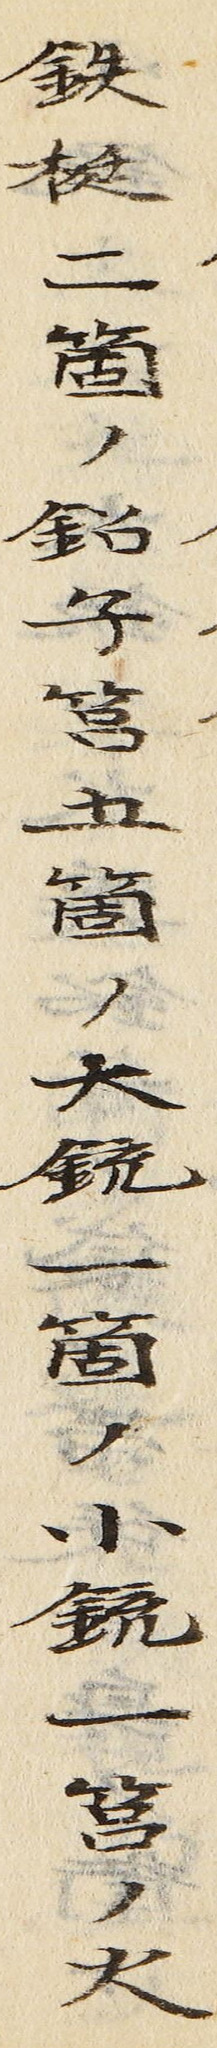鉄梃二箇ノ鉛子筥五箇ノ大銃一箇ノ小銃一筥ノ火
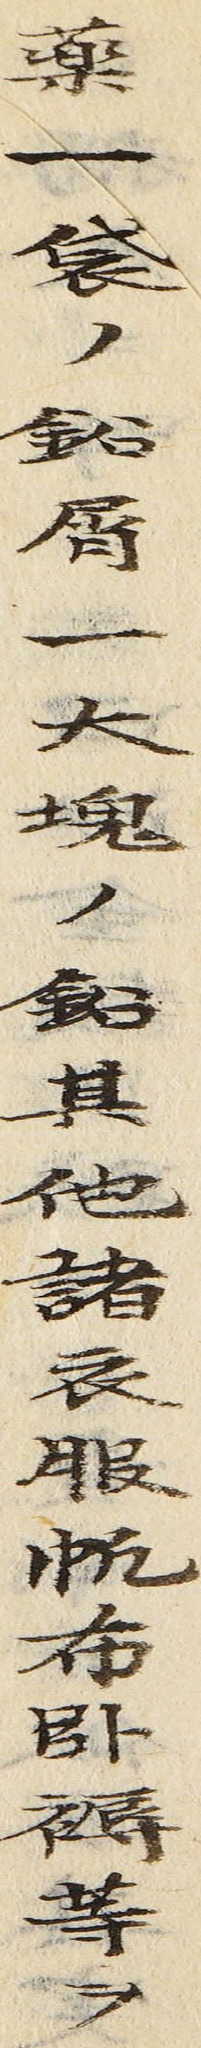薬一袋ノ鉛屑一大塊ノ鉛其他諸衣服帆布臥褥等ヲ
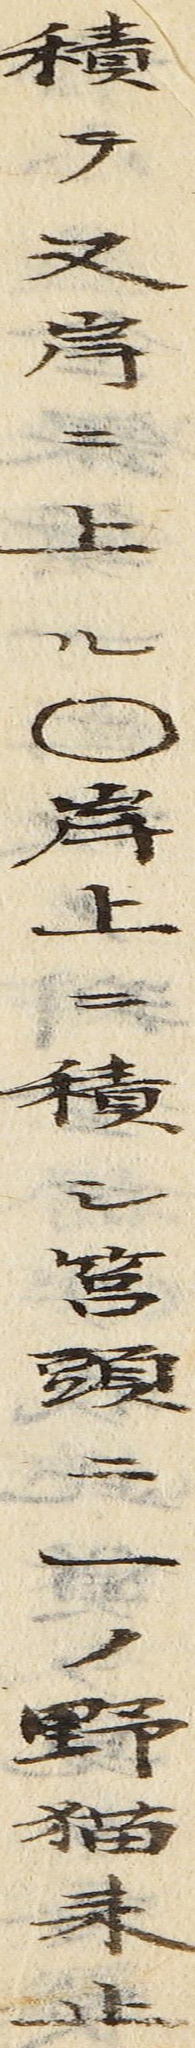積テ又岸ニ上ル◯岸上ニ積シ筥頭ニ一ノ野猫来止
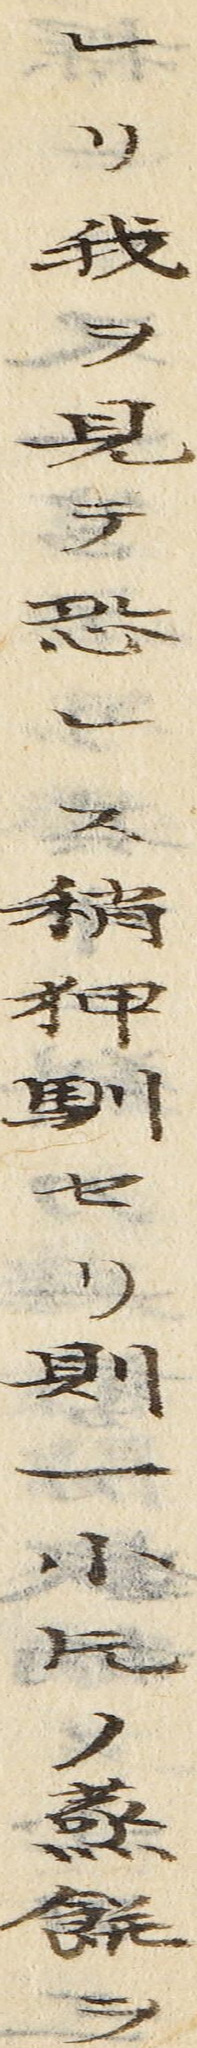レリ我ヲ見テ恐レス稍狎馴セリ則一小片ノ蒸餅ヲ
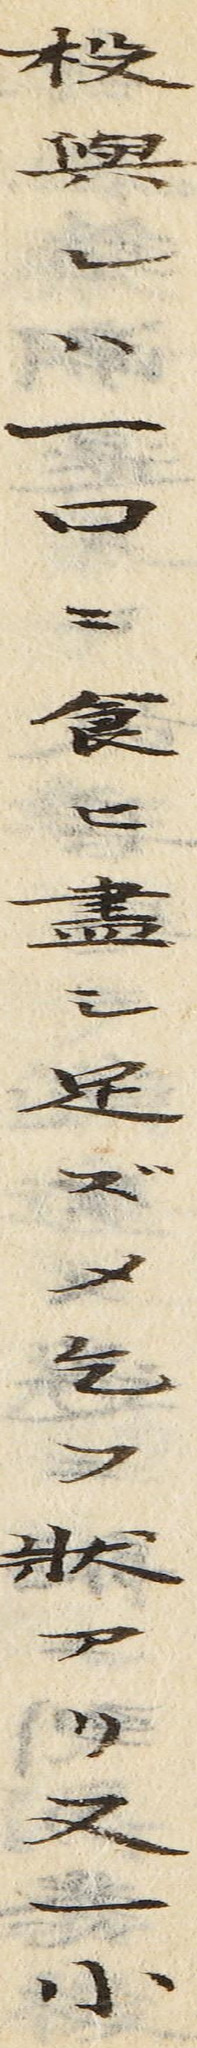投与レハ一口ニ食ヒ尽シ足ズシテ乞フ状アリ又一小
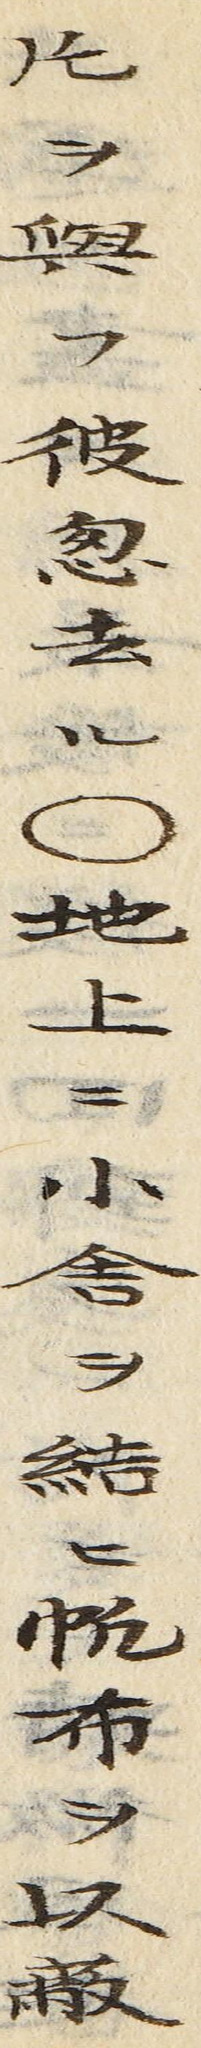片ヲ与フ彼忽去ル◯地上ニ小舎ヲ結ヒ帆布ヲ以蔽
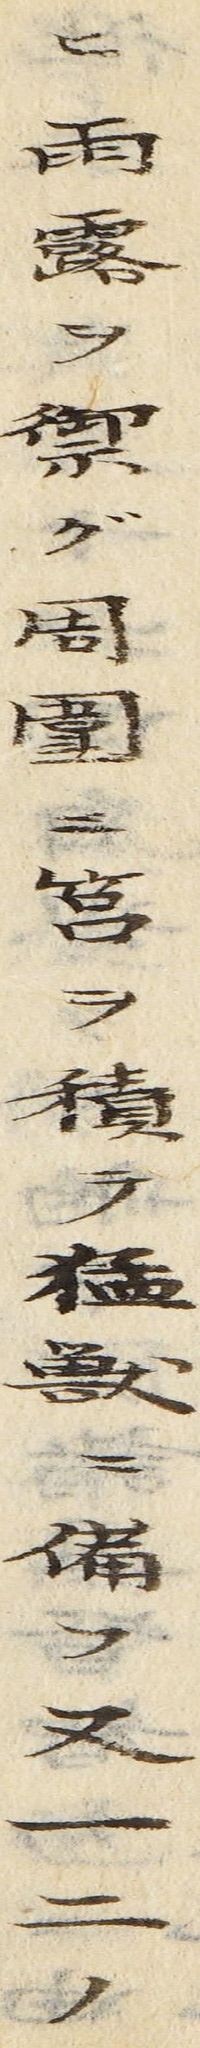ヒ雨露ヲ禦グ周囲ニ筥ヲ積テ猛獣ニ備フ又一二ノ
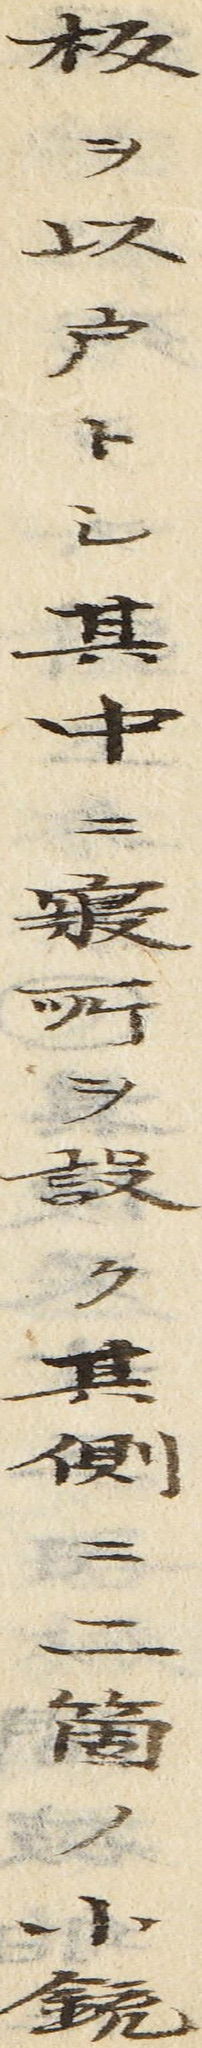板ヲ以戸トシ其中ニ寝所ヲ設ク其側ニ二箇ノ小銃
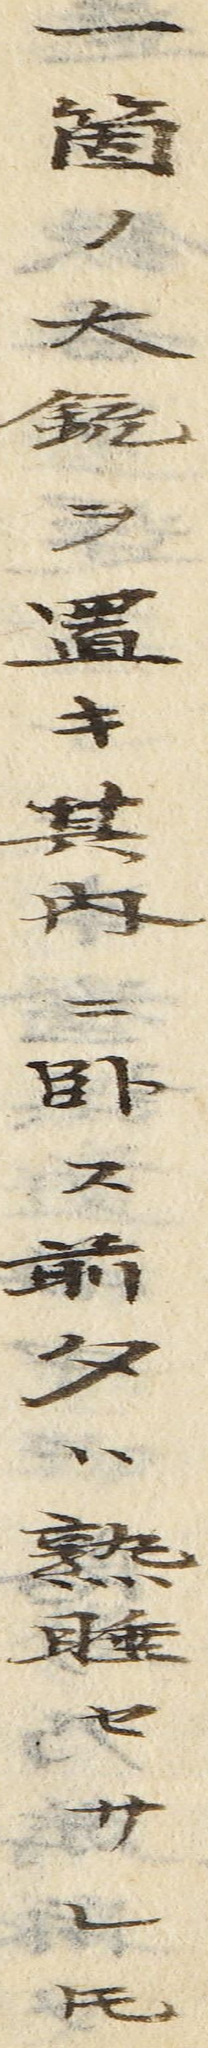一箇ノ大砲ヲ置キ其内ニ臥ス前夕ハ熟睡セサレトモ
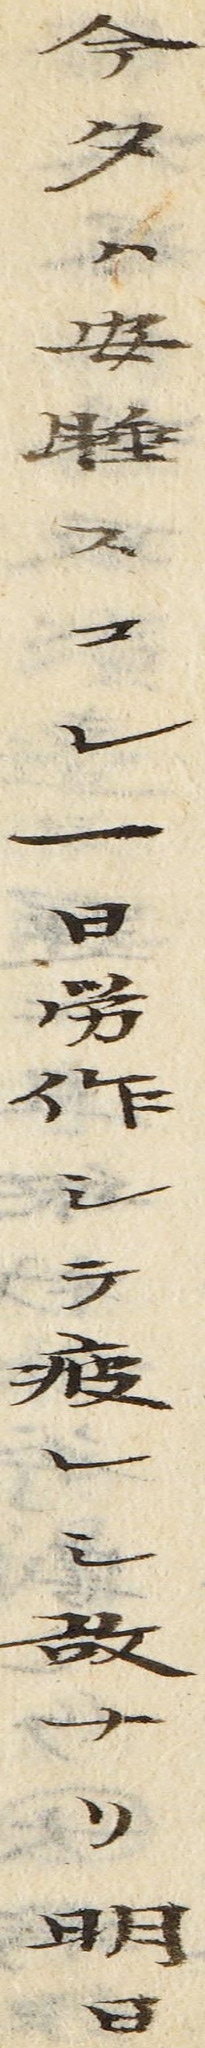今夕ハ安睡スコレ一日労作シテ疲レシ故ナリ明日
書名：漂流紀事
